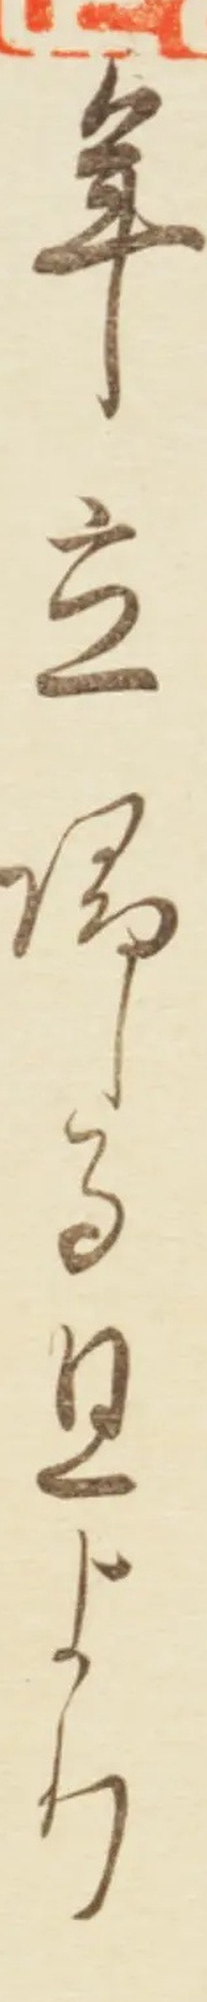年立帰る旦より
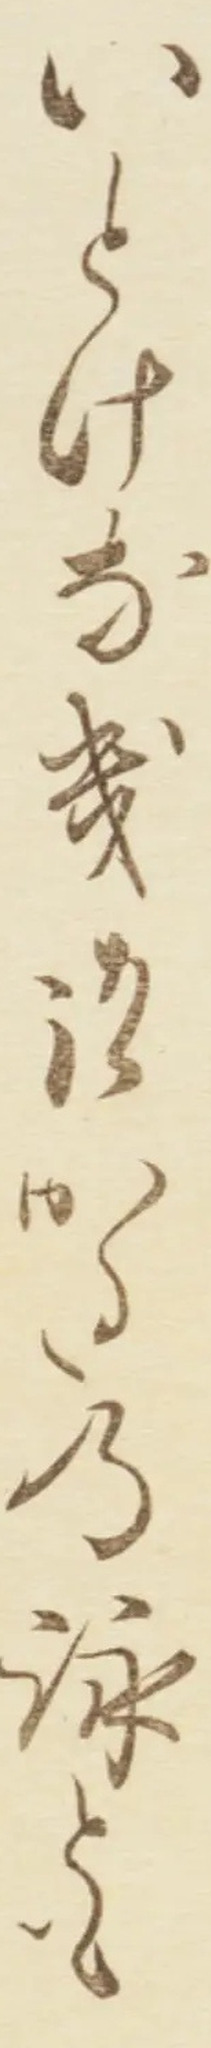いとけなき御かたの詠とも
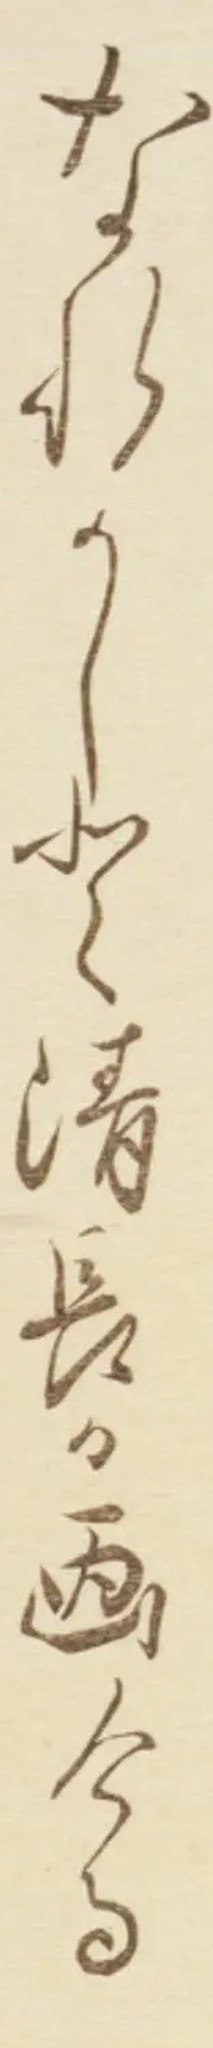なれかしと清長か画ける
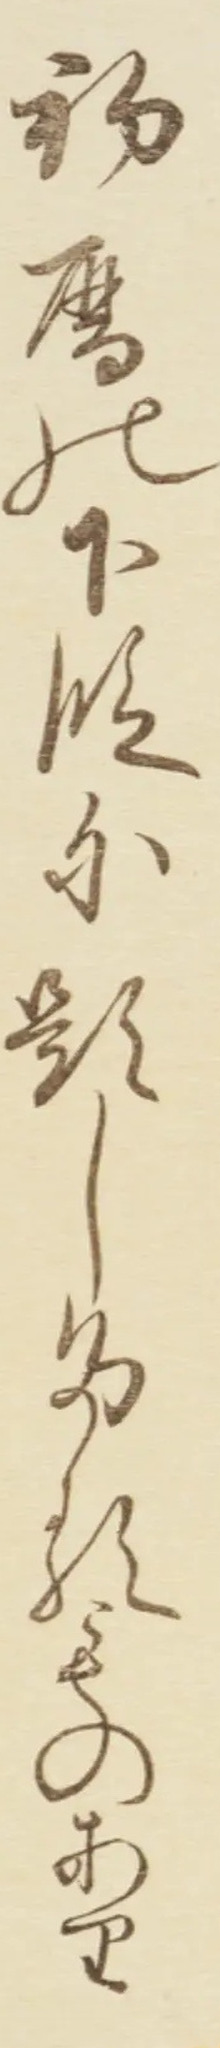初暦の下段に題したるものあり
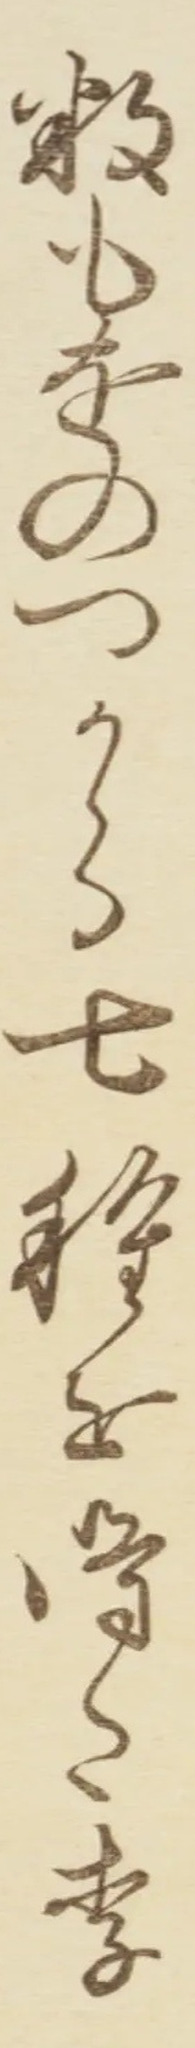数もをのつから七種を得たり
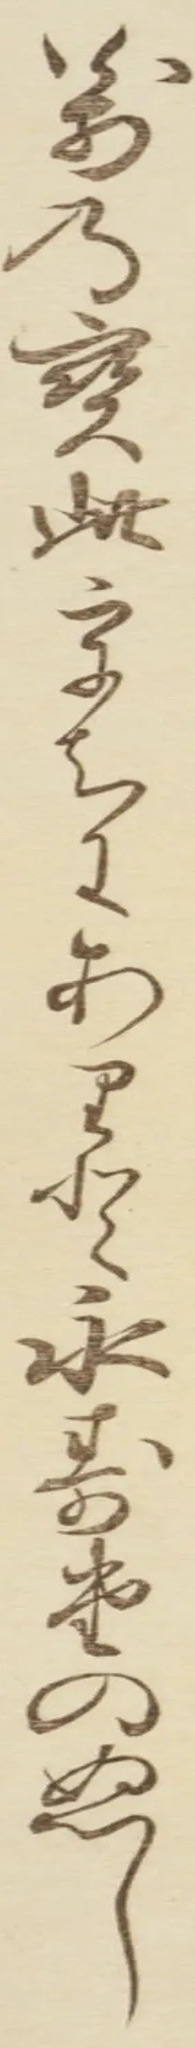萬の寶此うちにありと永寿堂のぬし
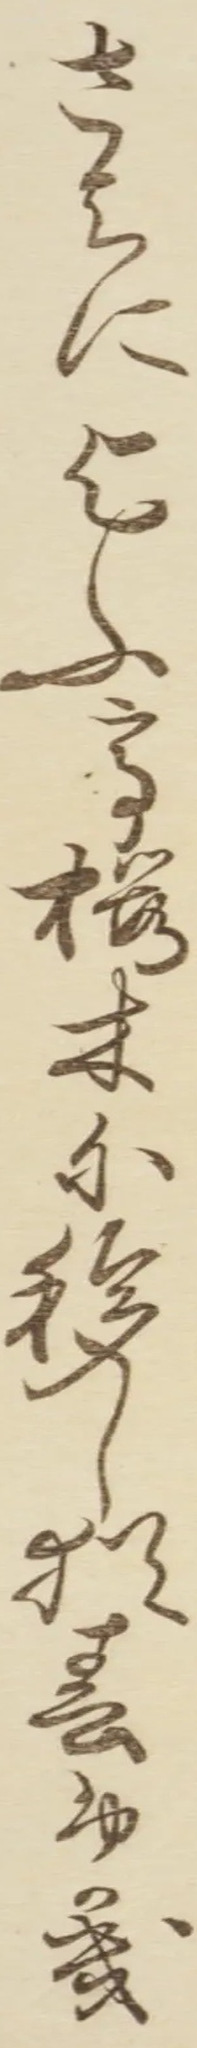さらに乞ふて桜木に移し猶春ふかき
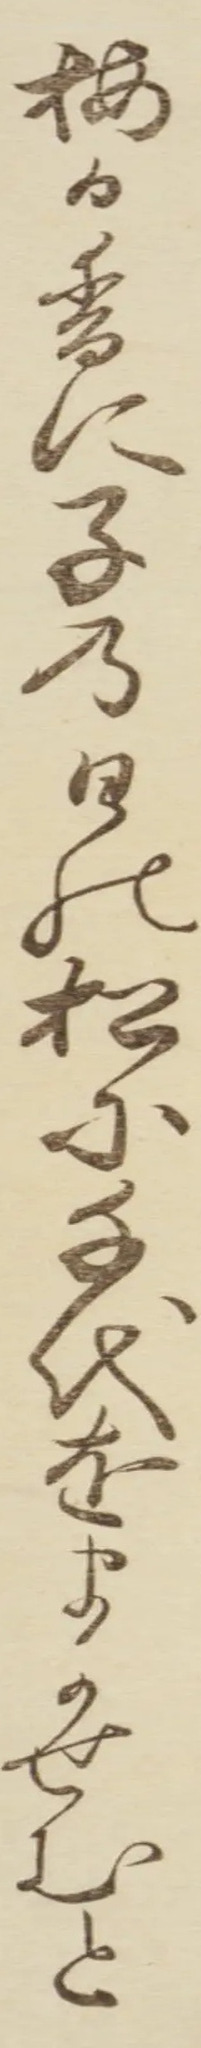梅か香に子の日の松に千代をまかせむと
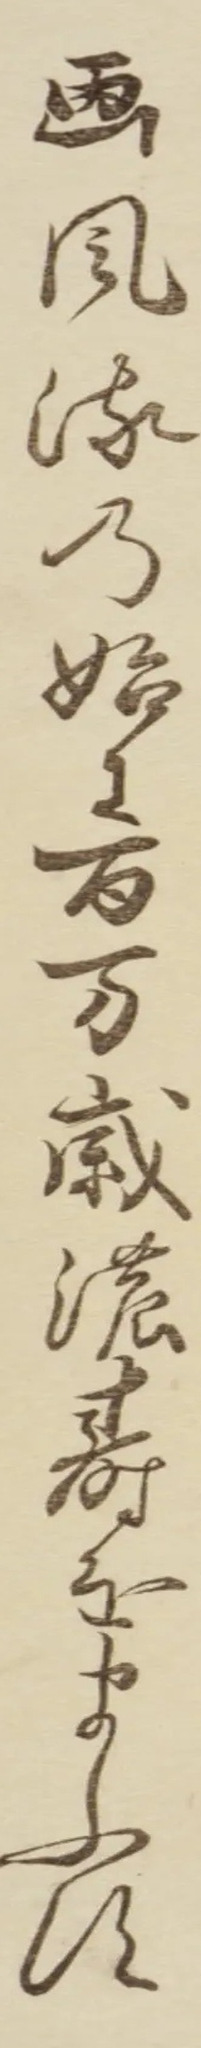画風流の始に百万歳の壽をまふす

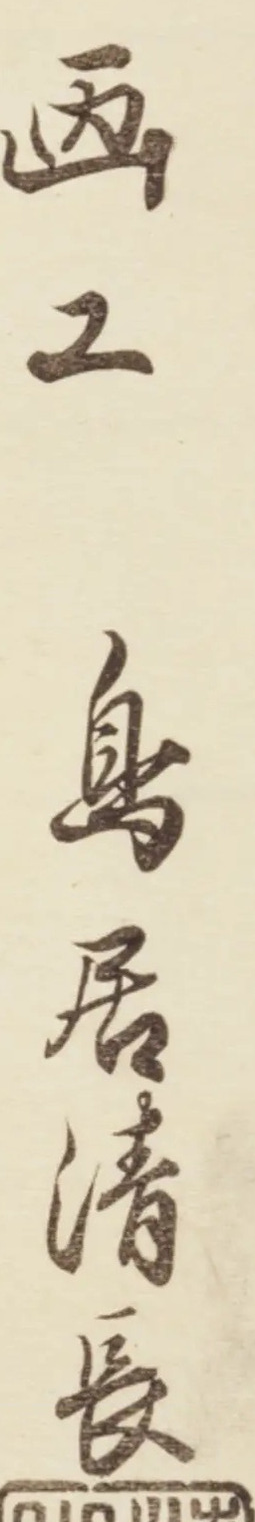画工鳥居清長
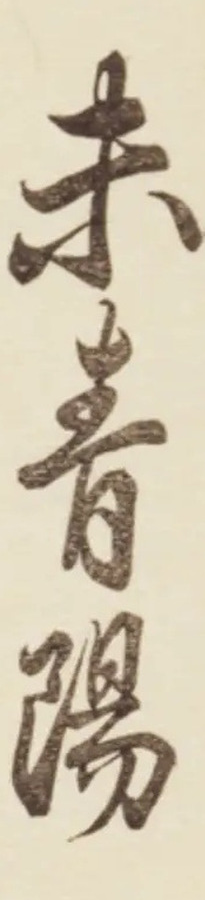未青陽
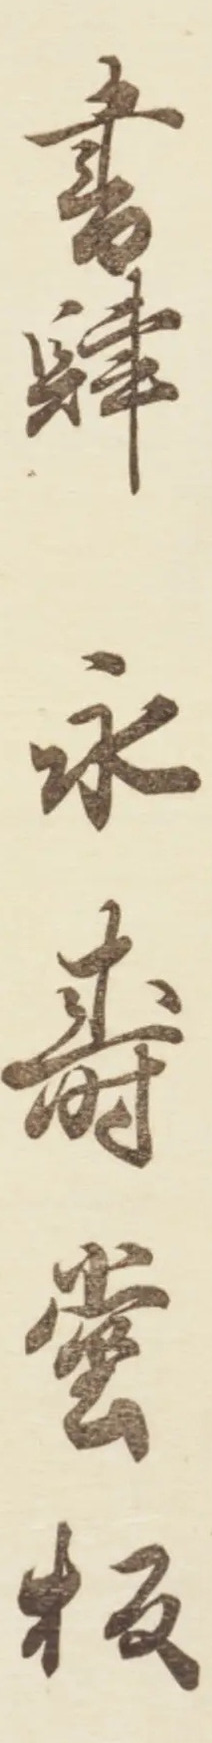書肆永壽堂板
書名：彩色美津朝
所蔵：国立国会図書館 National Diet Library, JAPAN
